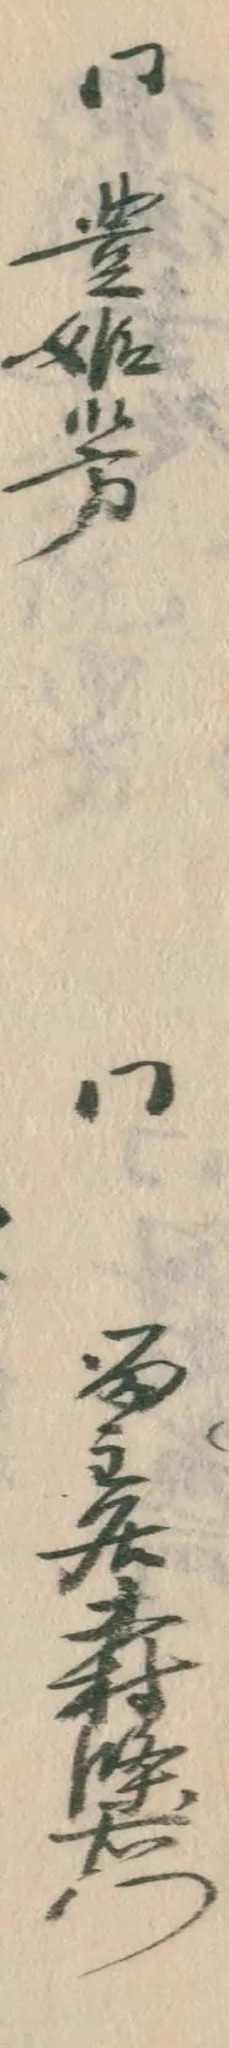同豊姫御方同留守居大村條右衛門
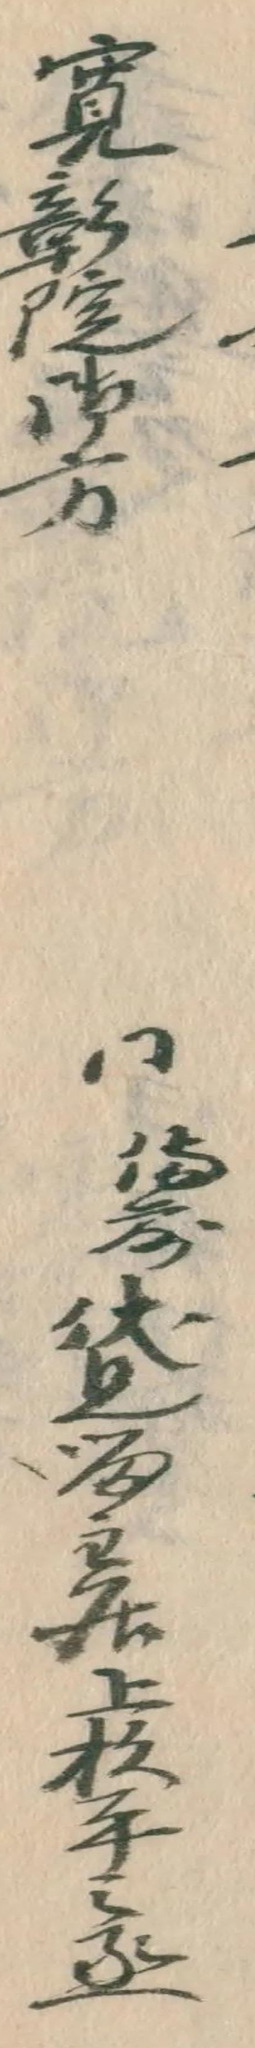寛彰院御方同備前伏見留主居上杉平之丞
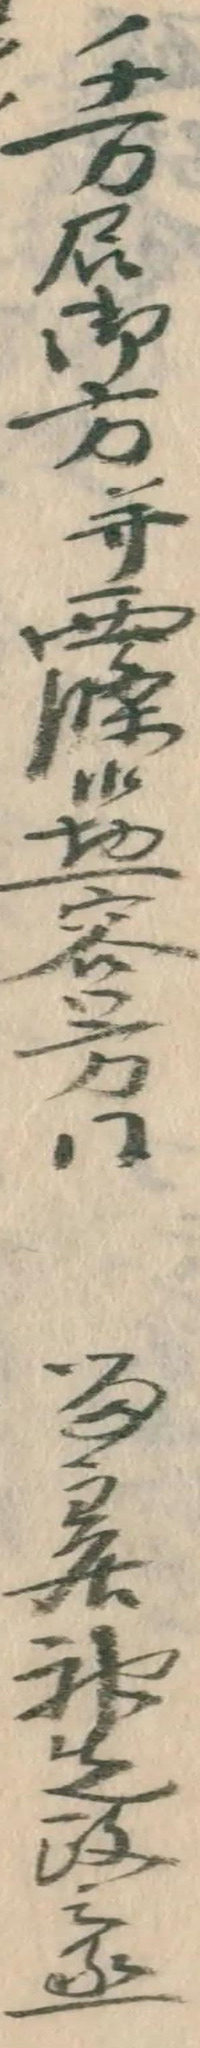千万君御方幷西條御惣容御方同留主居神先政之丞

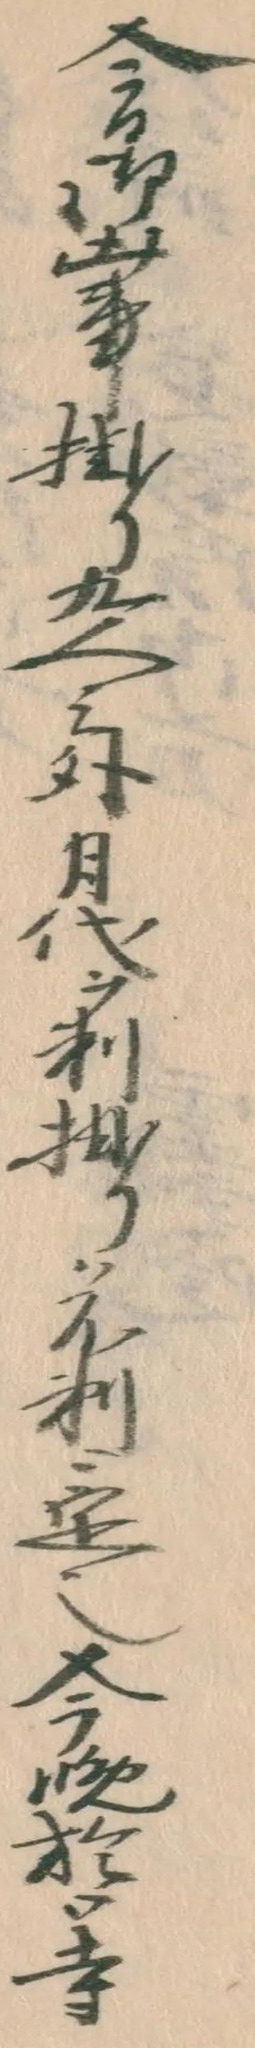今日御凶事掛り九人之外月代ヲ剃掛り御不利ニ定也今晩於御寺
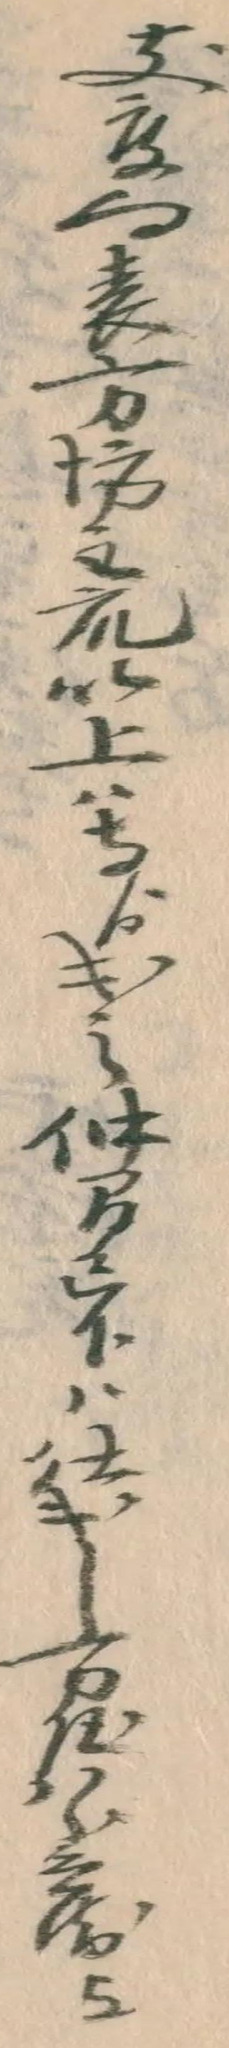支度向表方坊主衆以上ハ寺ゟ出之仲間已下ハ仕出し万屋ハ郎兵衛と
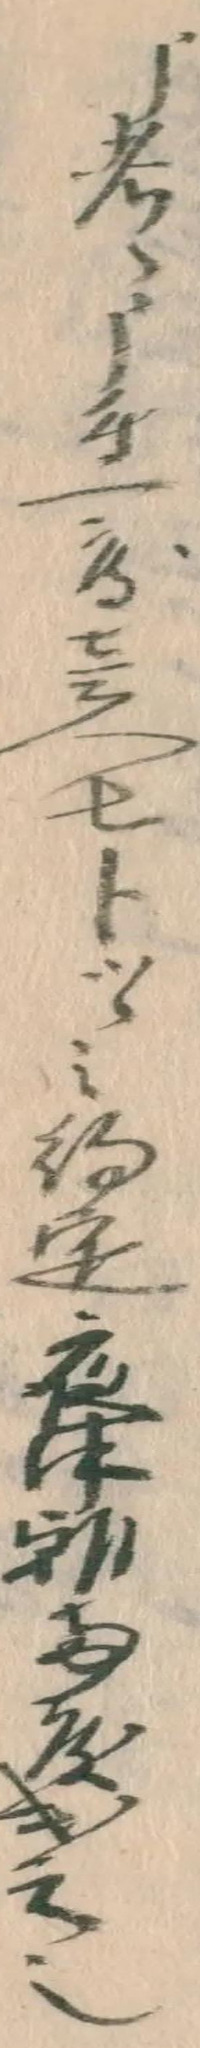申者へ申付ニ付一度壱人七分ツヽ之約定夜中朝両度出之也
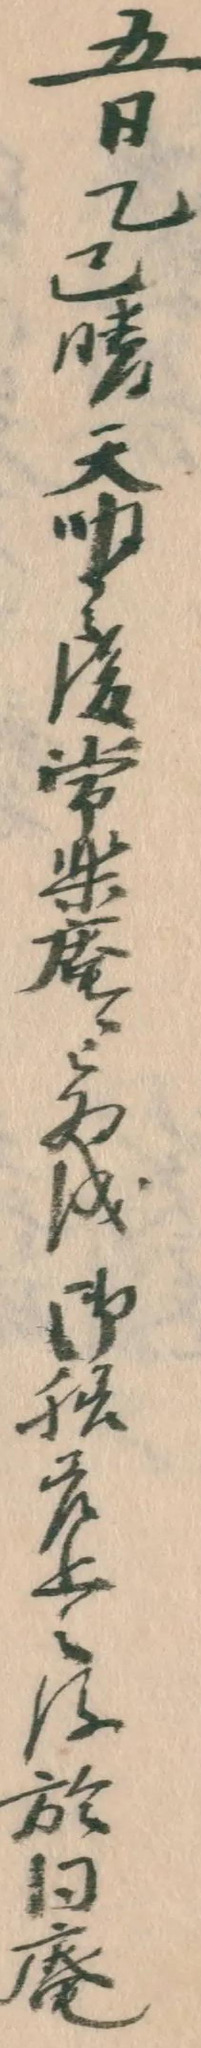五日乙巳晴天明之後常楽庵ニ被為成御膳差上之後於同庵
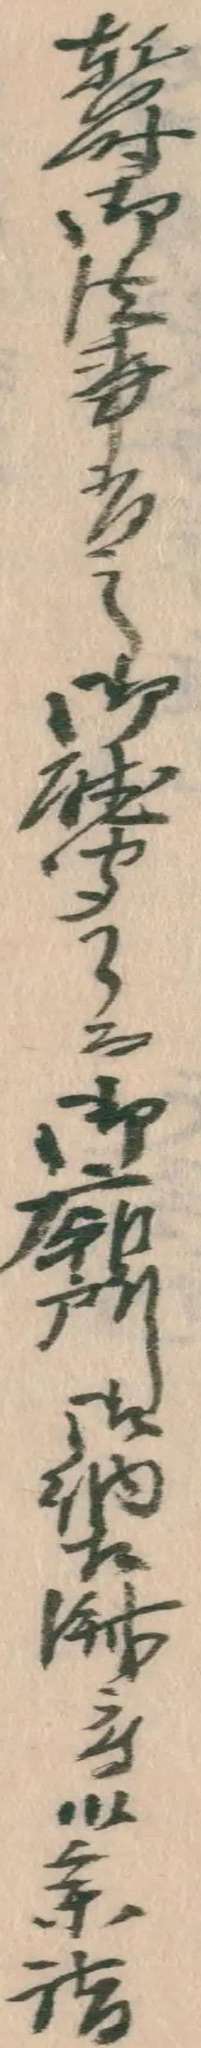暫時御法事有之御聴聞了而御廟所御納相済ニ付御参詣
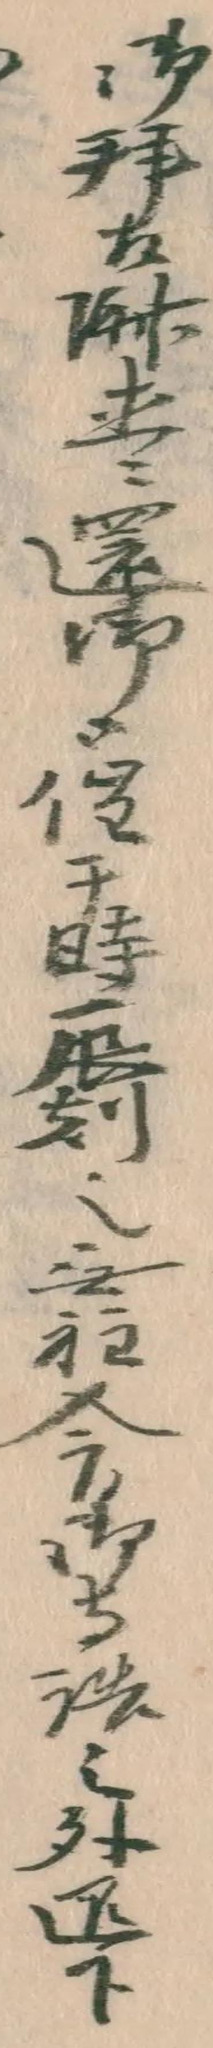御拝相済直ニ還御御催于時辰刻也無程今御寺詰之外退下
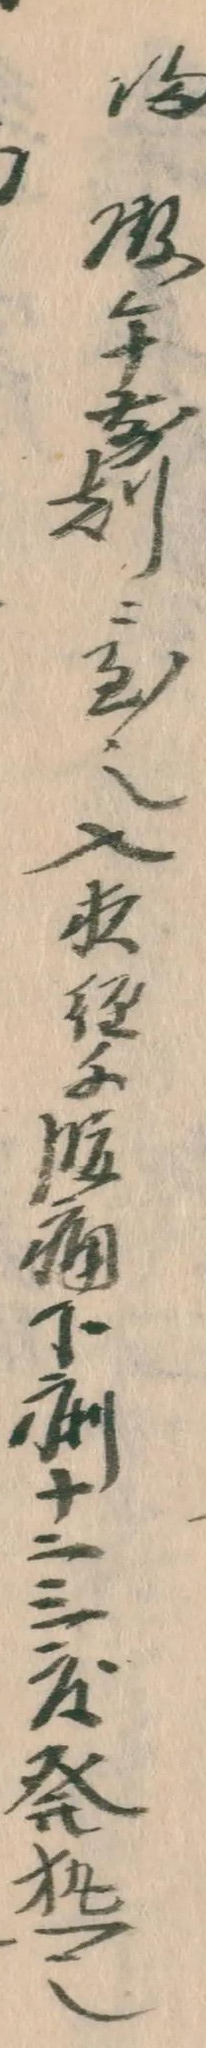帰殿午前刻ニ至也入夜経千腹痛下痢十二三度発熱也
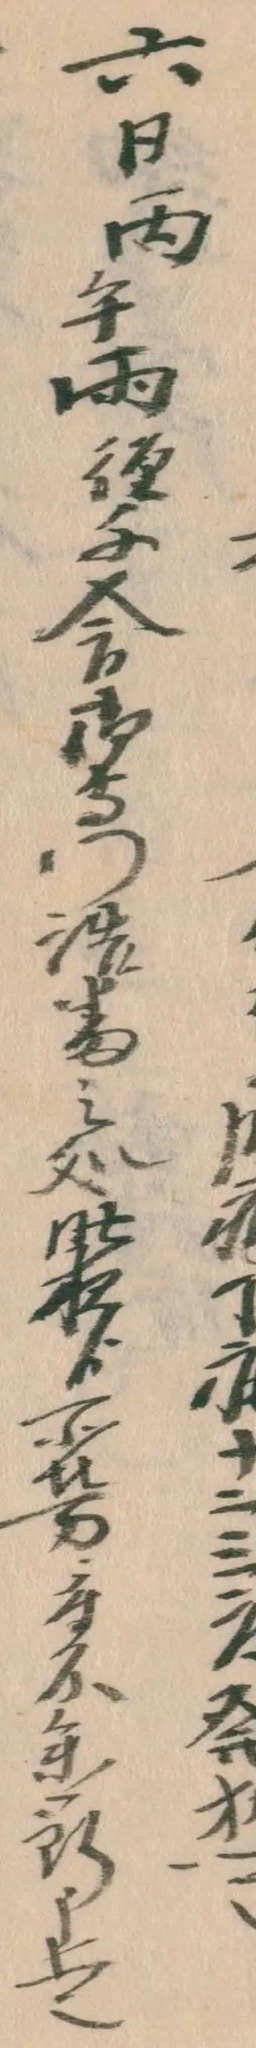六日丙午雨経千今日御寺門詰番之処昨夜ゟ所労ニ付不参御断申上也
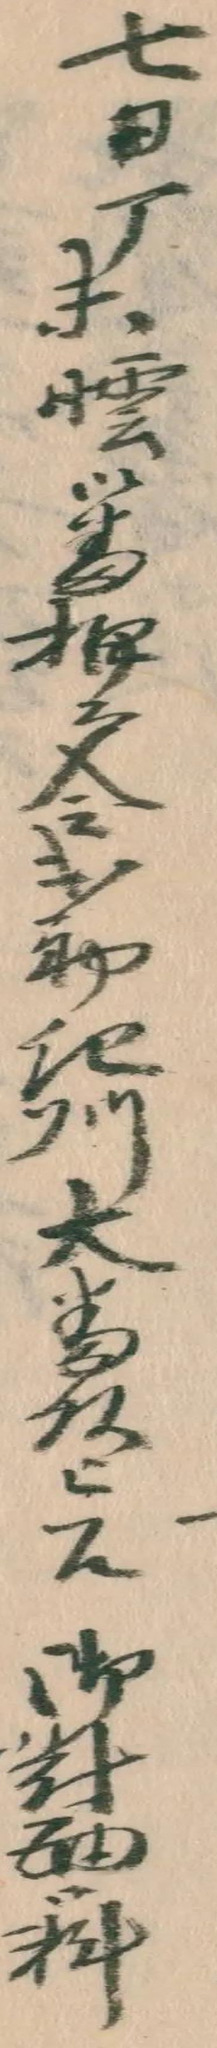七日丁未曇御番押而令出勤紀州大番頭被召御對面御料
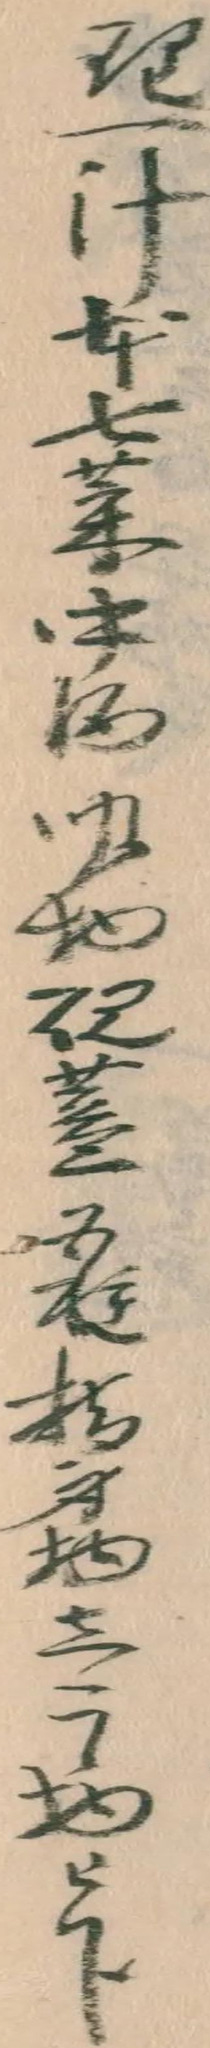理一汁本七菜中酒吸物硯蓋五種指身物したし物被下
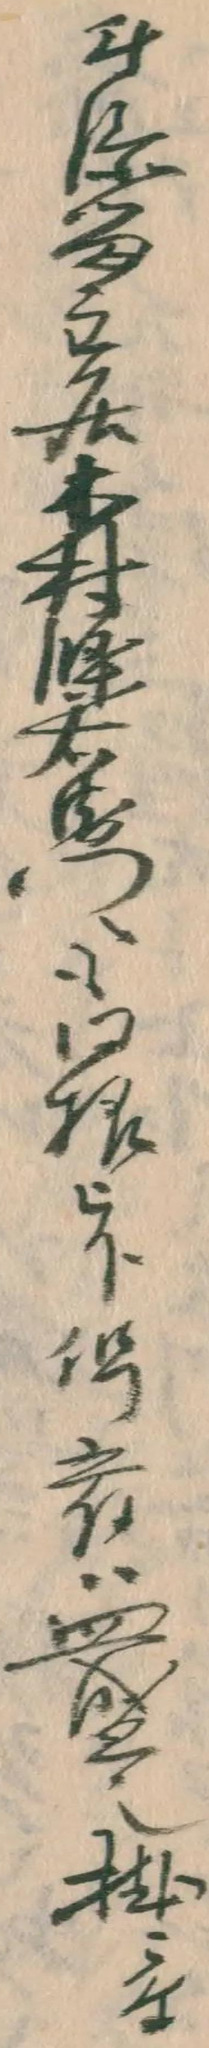付添留主居木村條右衛門へも同様被下但し肴ハ皿盛也之掛ニ付
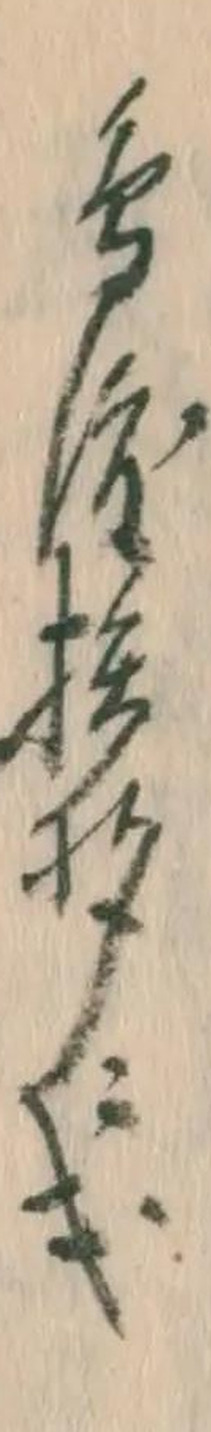鳥渡挨拶に出
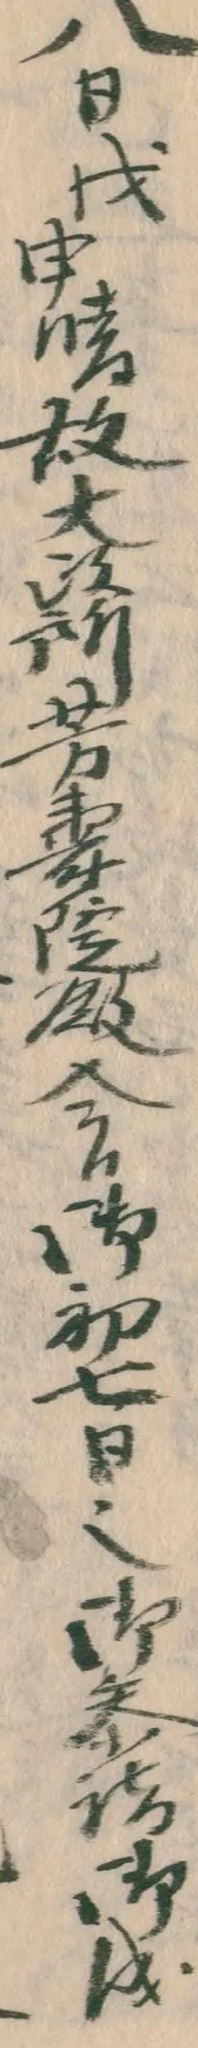八日戊申晴故大政所昔壽院殿今日御初七日也御参詣御成
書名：賀茂社記録. 第69冊
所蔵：国立国会図書館 National Diet Library, JAPAN
